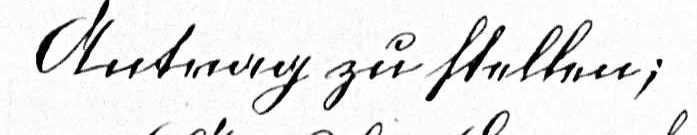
Antrag zu stellen;
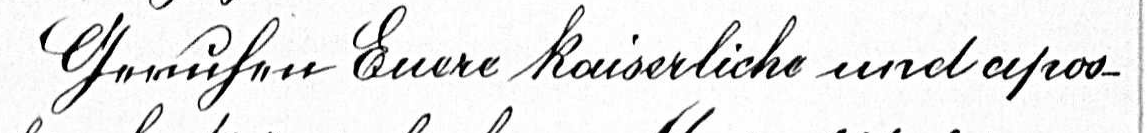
Geruhen Euere kaiserliche und apos¬
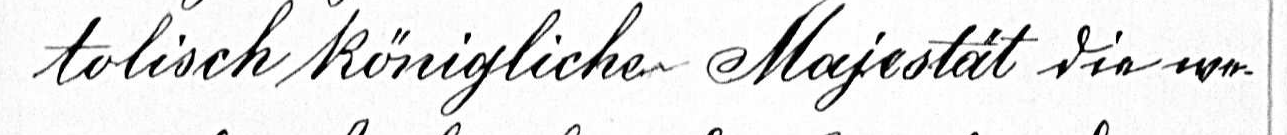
tolisch königliche Majestät die we¬
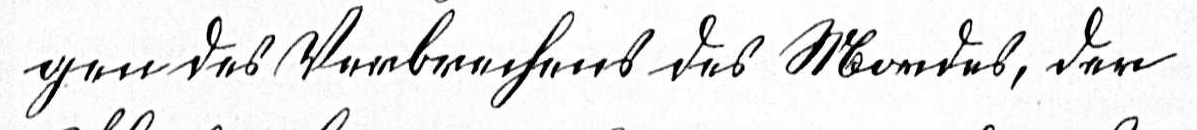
gen des Verbrechens des Mordes, der
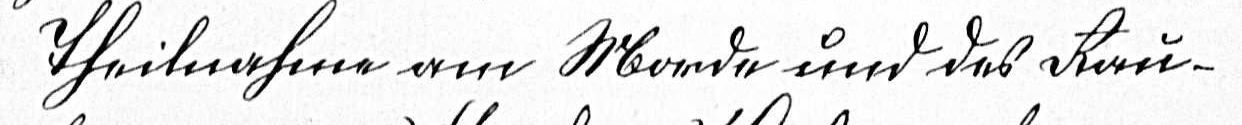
Theilnahme am Morde und des Rau¬
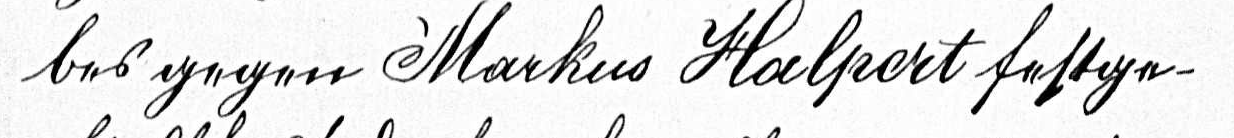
bes gegen Markus Halpert festge¬
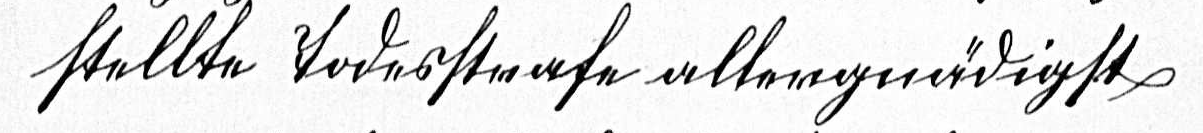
stellte Todesstrafe allergnädigst
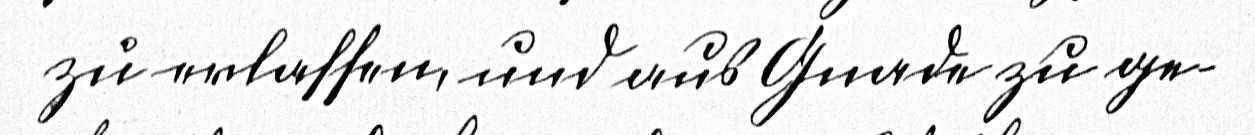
zu erlassen und aus Gnade zu ge¬
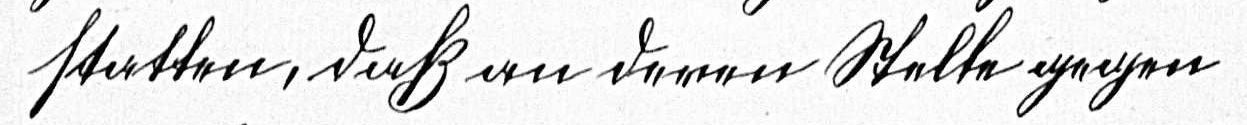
statten, daß an deren Stelle gegen
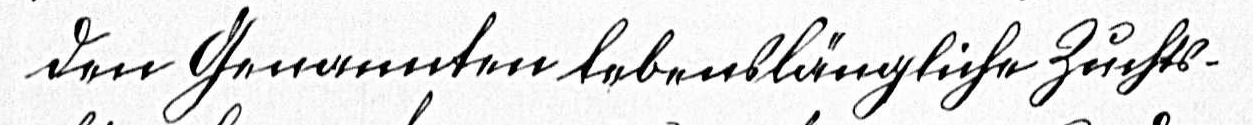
den Genannten lebenslängliche Zuchts¬
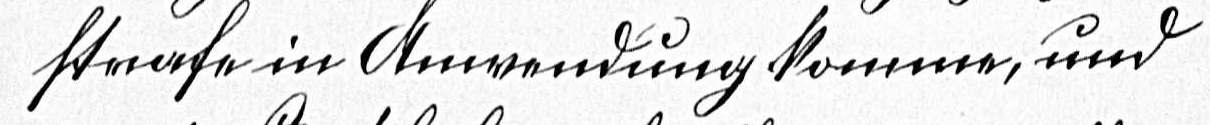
strafe in Anwendung komme, und
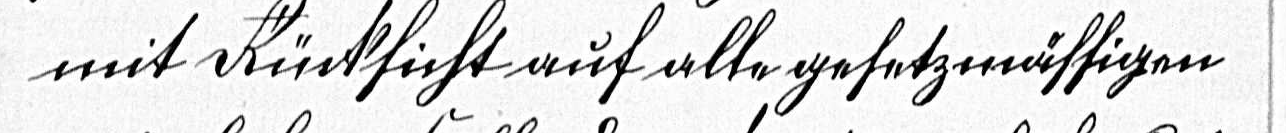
mit Rücksicht auf alle gesetzmässigen
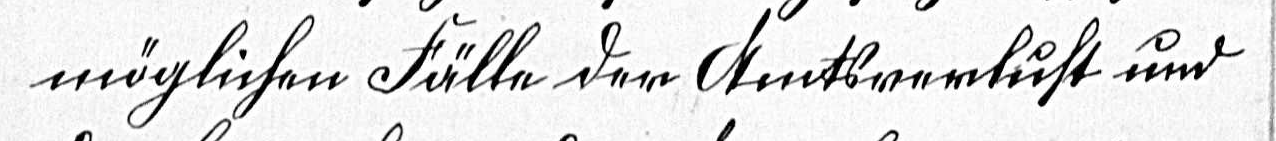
möglichen Fälle der Amtsverlust und
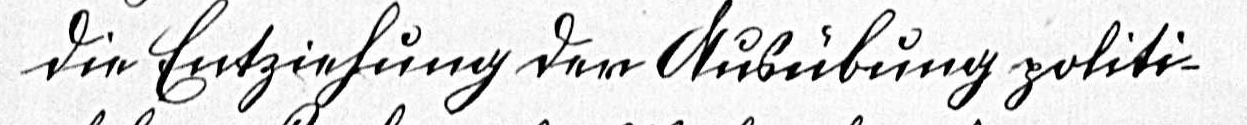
die Entziehung der Ausübung politi¬
